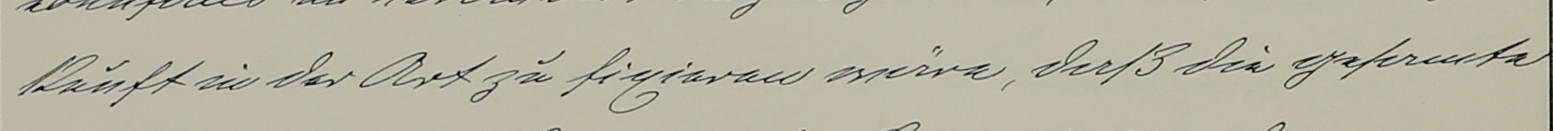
kunft in der Art zu fixieren wäre, daß die gesamte
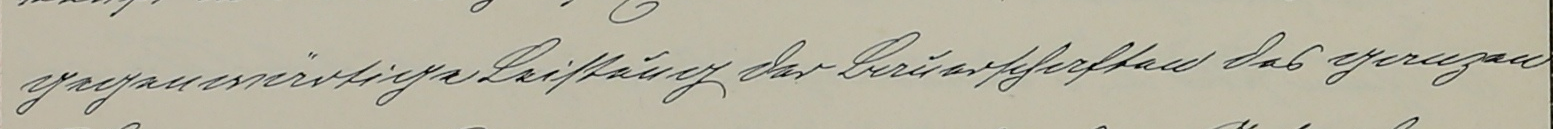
gegenwärtige Leistung der Bauerschaften des ganzen
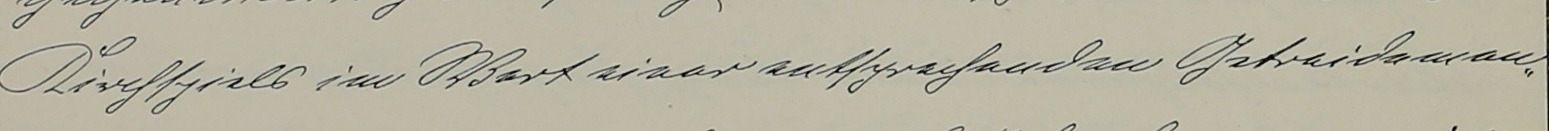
Kirchspiels im Wert einer entsprechenden Getreidemen-
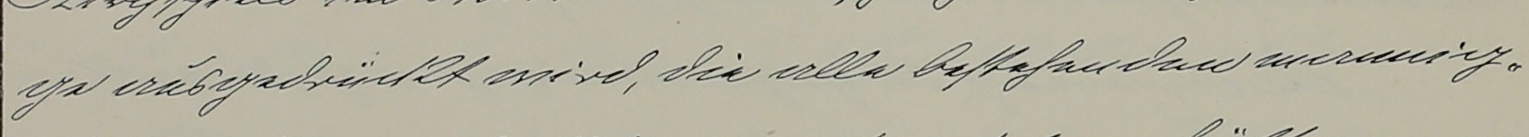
ge ausgedrückt wird, die alle bestehenden mannig-
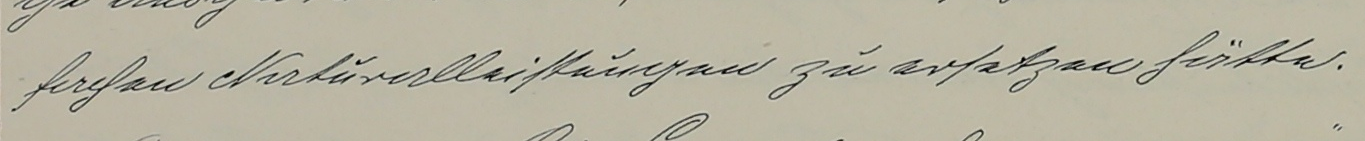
fachen Naturalleistungen zu ersetzen hätte.
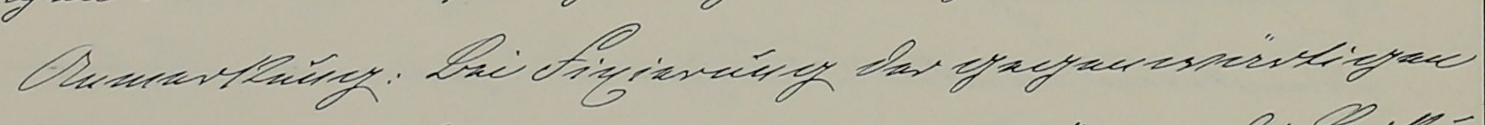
Anmerkung: Bei Fixierung der gegenwärtigen
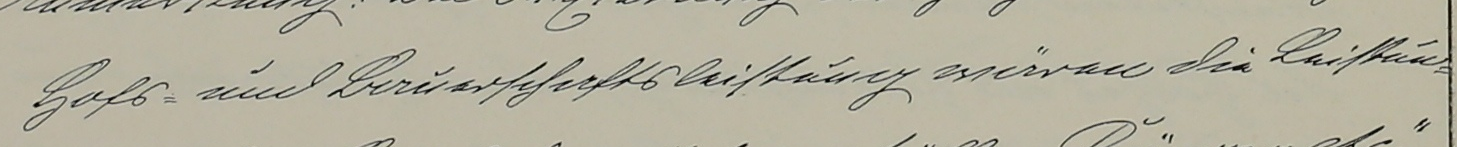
Hofs- und Bauerschaftsleistung wären die Leistun-
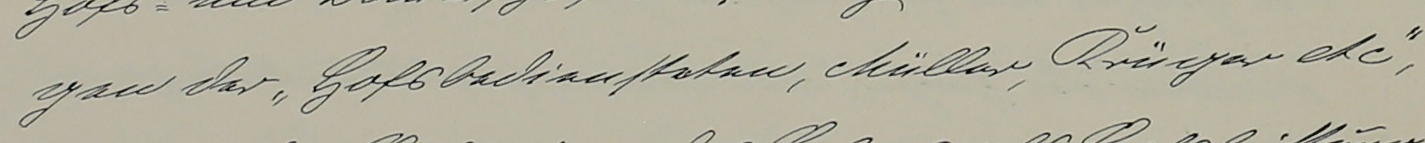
gen der „Hofsbediensteten, Müller, Krüger etc“,
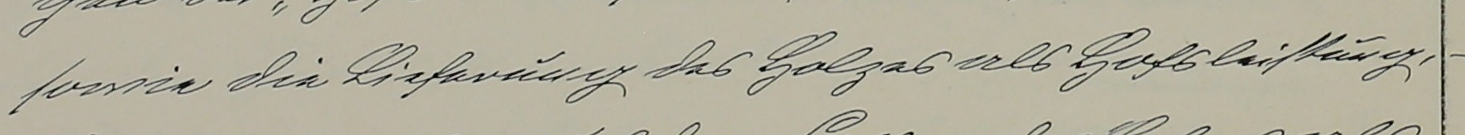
sowie die Lieferung des Holzes als Hofsleistung,
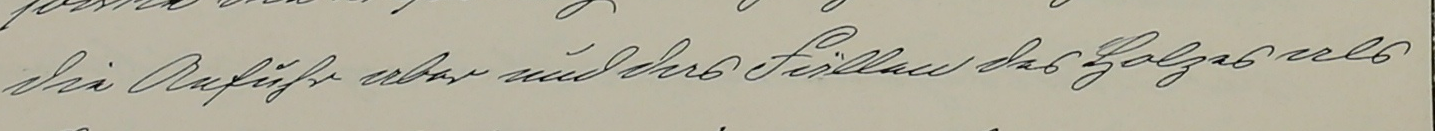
die Anfuhr aber und das Fällen des Holzes als
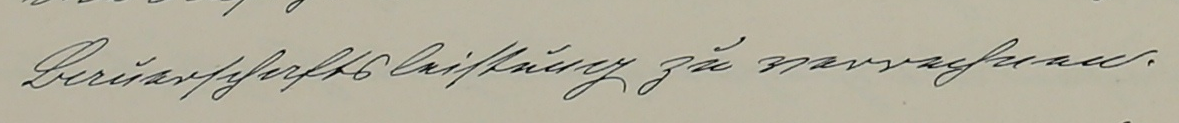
Bauerschaftsleistung zu verrechnen.
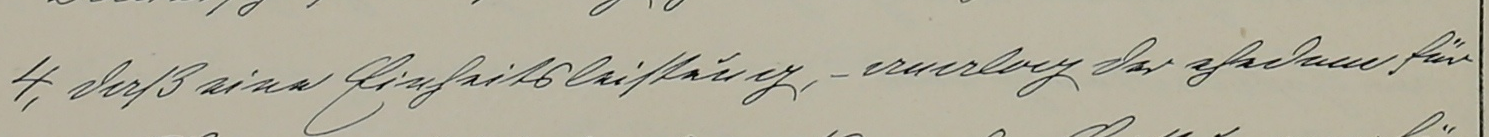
4. daß eine Einheitsleistung, – analog der ehedem für
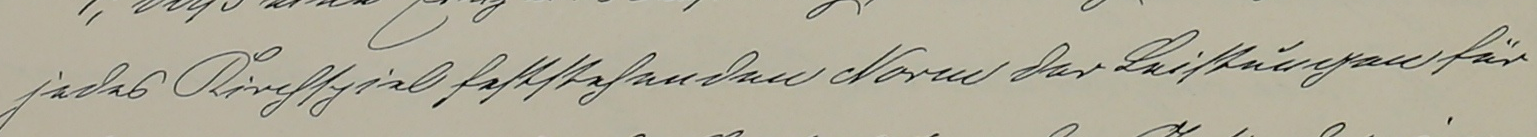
jedes Kirchspiel feststehenden Norm der Leistungen für
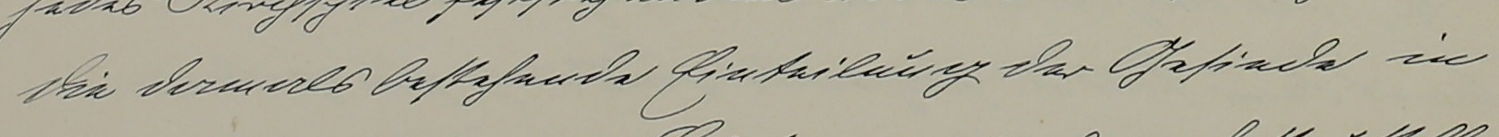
die damals bestehende Einteilung der Gesinde in
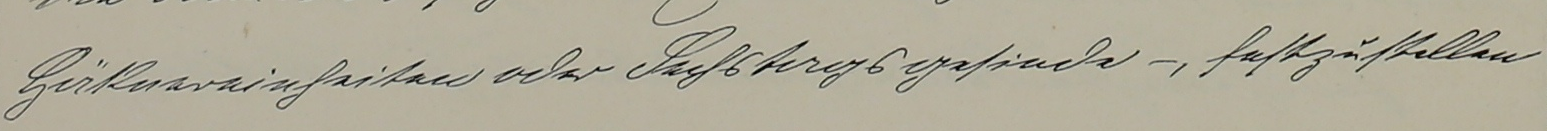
Häknereinheiten oder Sechstagsgesinde, – festzustellen
